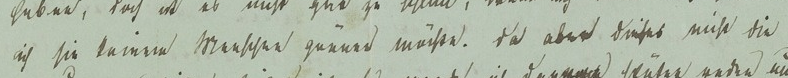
ich sie keinem Menschen gönnen möchte. Da aber dieses nicht die
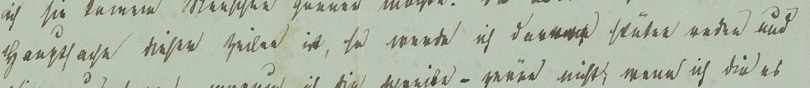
Hauptsache dieser Zeilen ist, so werde ich darvon später reden und
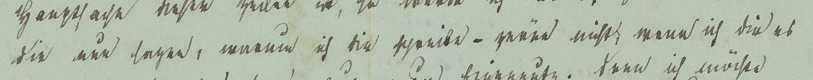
dir nun sagen, warum ich dir schreibe – zürne nicht, wenn ich dir es
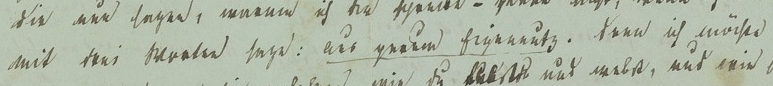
mit drei Worten sage: aus purem Eigennutz. Denn ich möchte
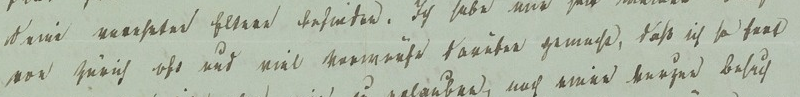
von Zürich oft und viel Vorwürfe darüber gemacht, daß ich so fort
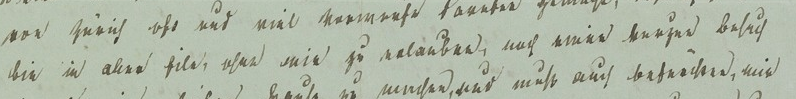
bin in aller Eile, ohne mir zu erlauben, noch einen kurzen Besuch
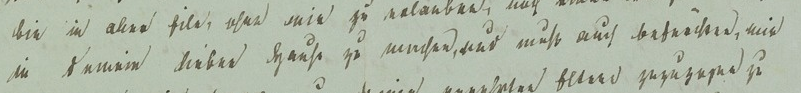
in deinem lieben Hause zu machen, und muß auch befürchten, mir
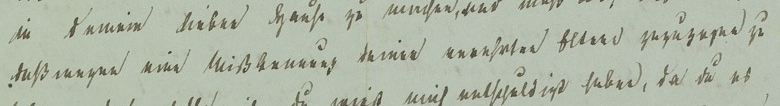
deßwegen eine Mißkennung deiner verehrten Eltern zugezogen zu
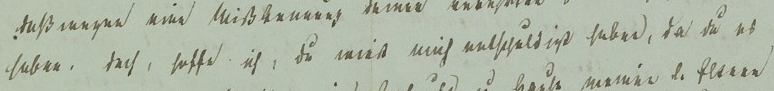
haben. Doch, hoffe ich, du wirst mich entschuldigt haben, da du es
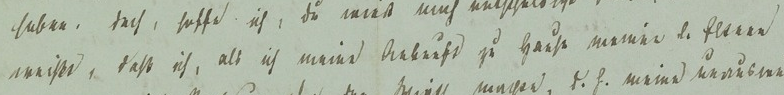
weißt, daß ich, als ich meine Ankunft zu Hause meinen l. Eltern
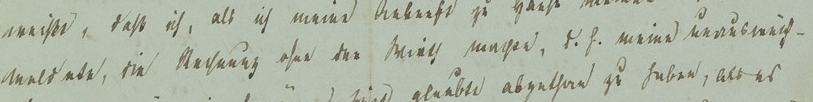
meldete, die Rechnung ohne den Wirth machte, d. h. meine unausweich-
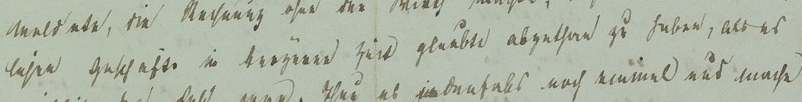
lichen Geschäfte in kürzerer Zeit glaubte abgethan zu haben, als es
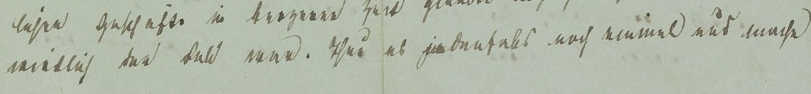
wirklich der Fall war. Thue es jedenfalls noch einmal und mache
